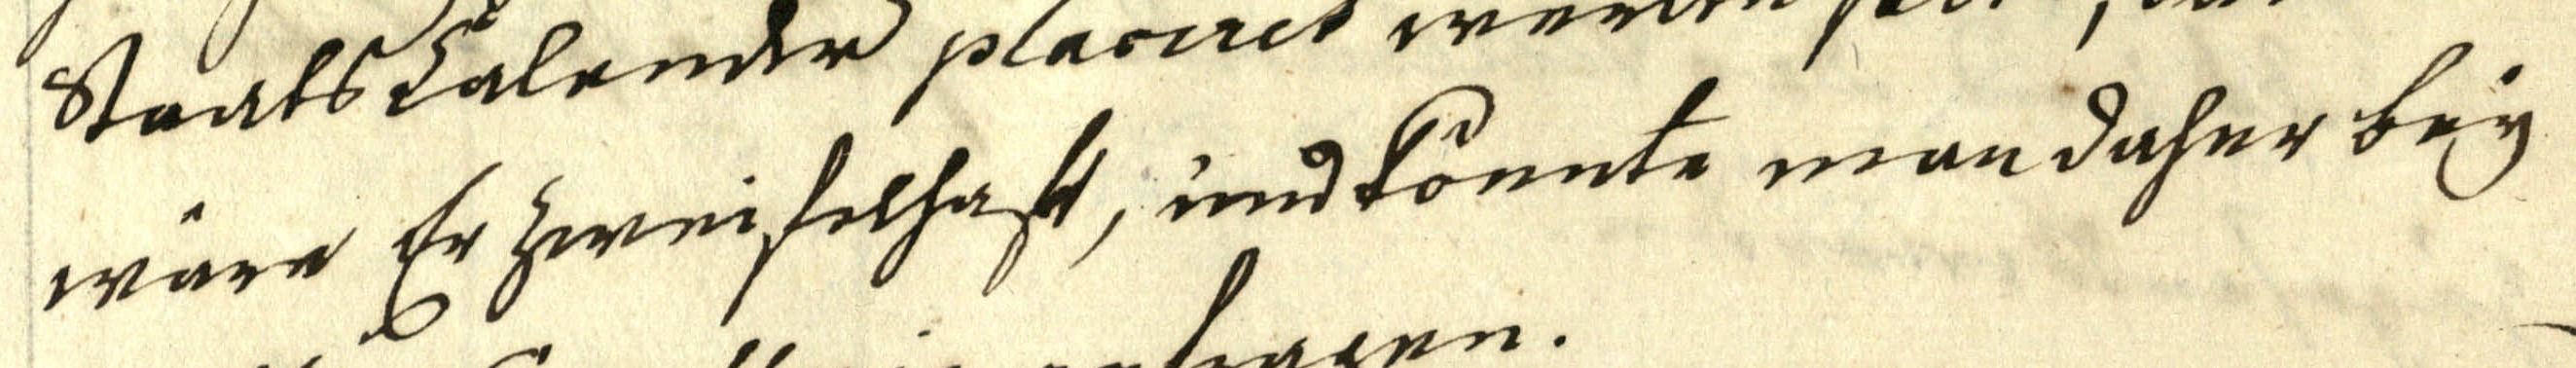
wäre Er zweifelhaft, und könnte man daher beÿ
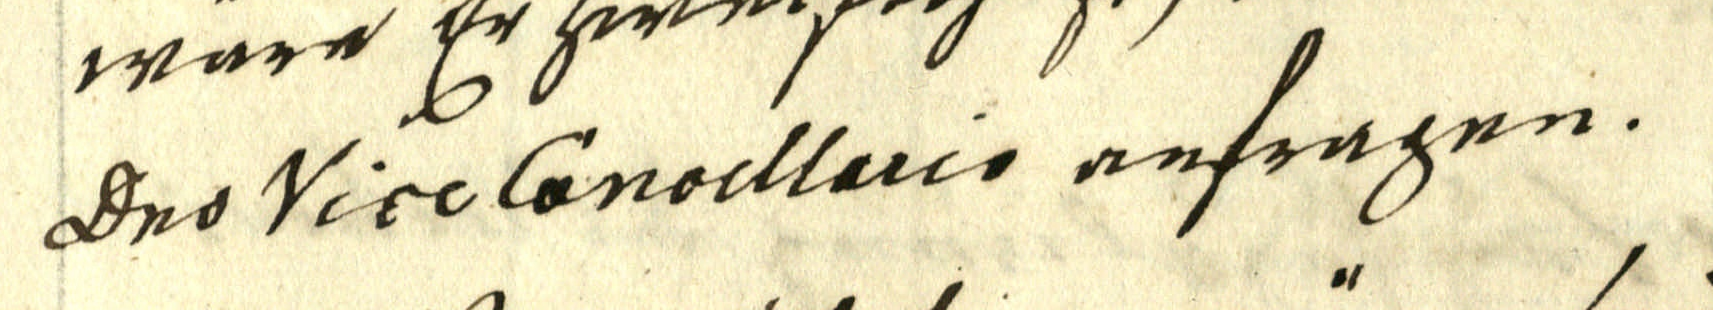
Dno ViceCancellario anfragen.
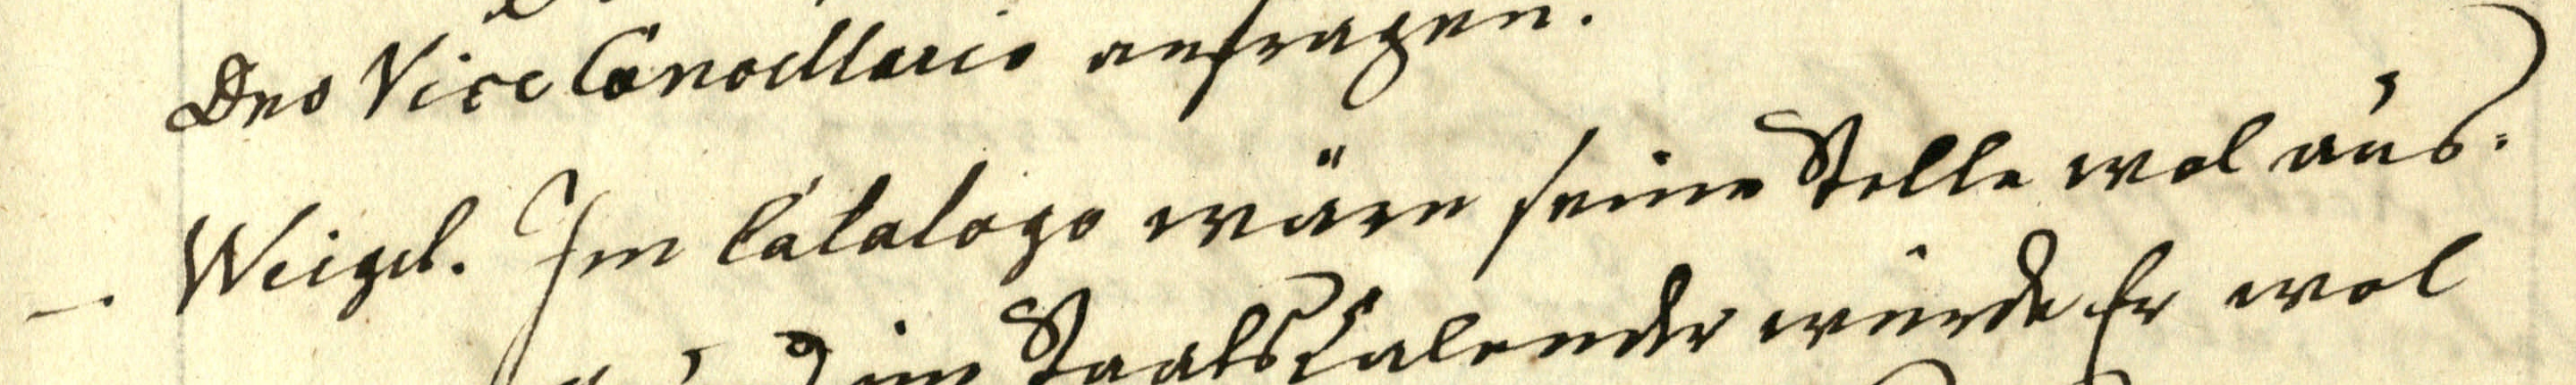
Weigel. Ihm Catalogo wäre seine Stelle wol aus¬
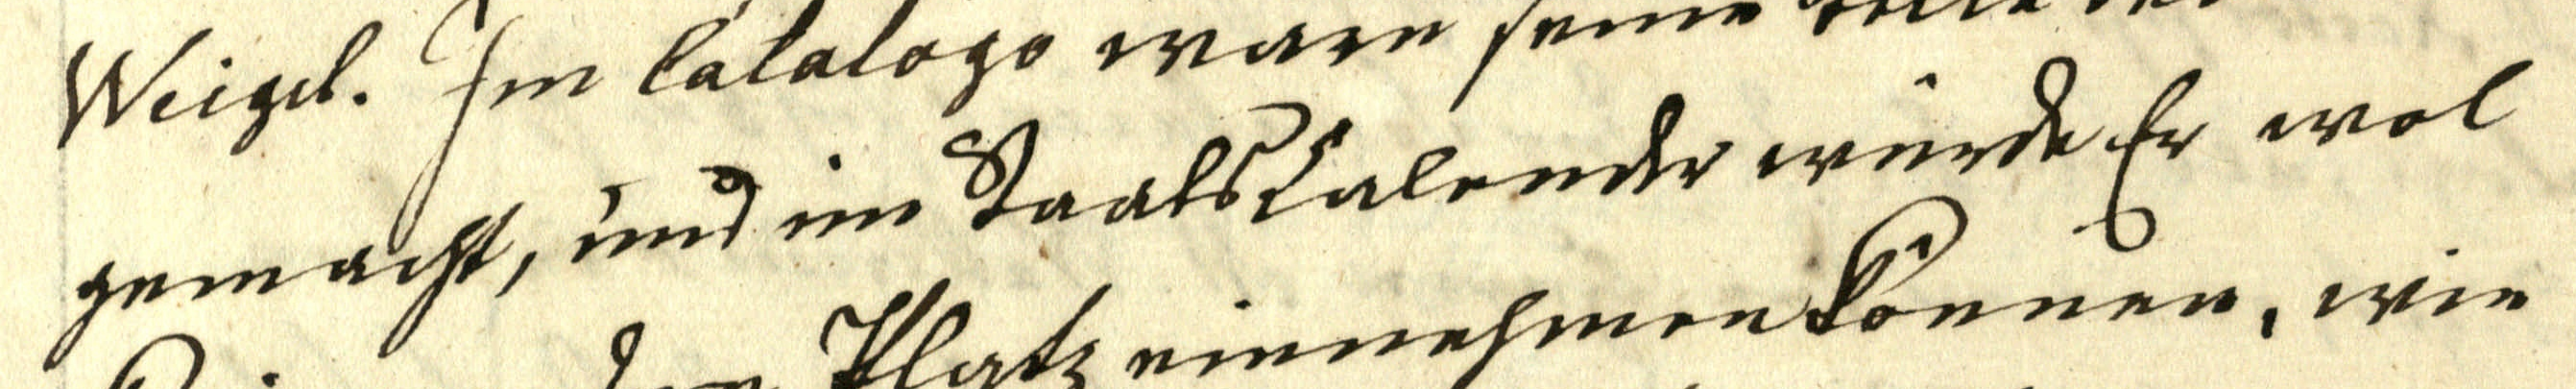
gemacht, und im Staatskalender würde Er wol
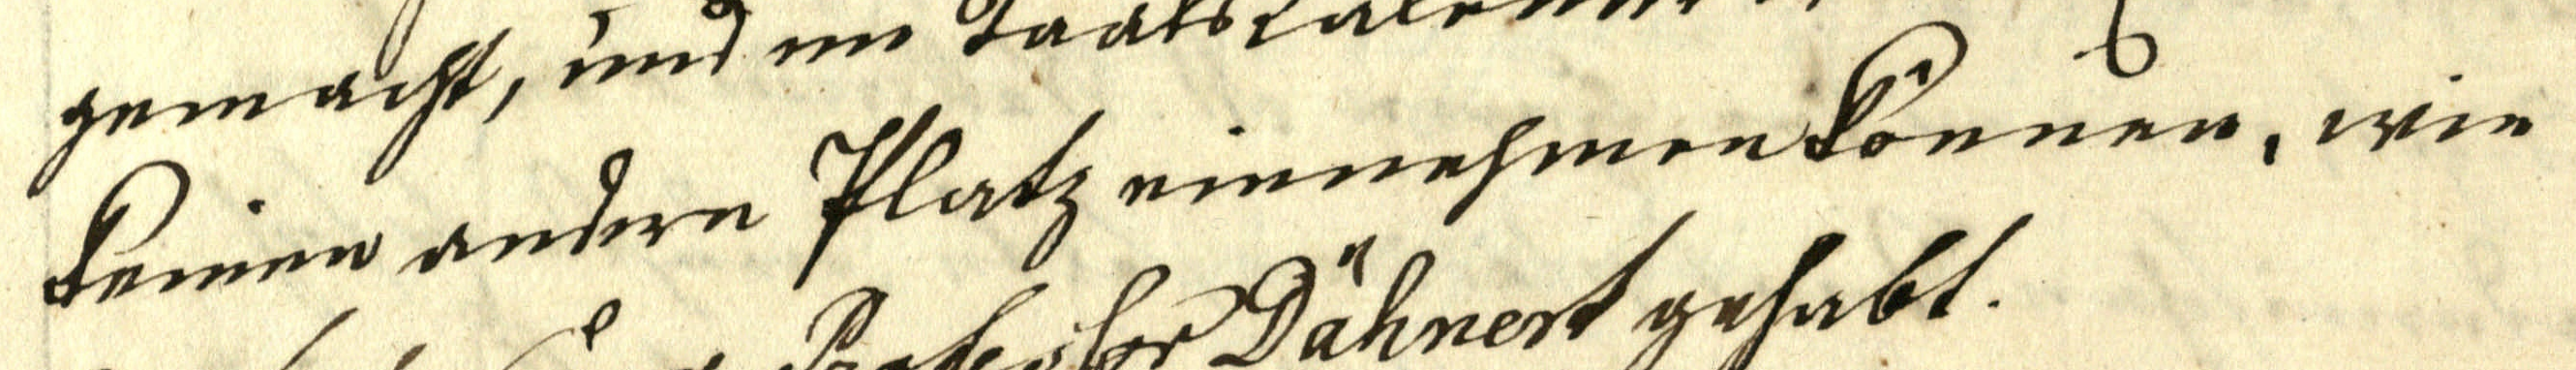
keinen andern Platz einnehmen können, wie
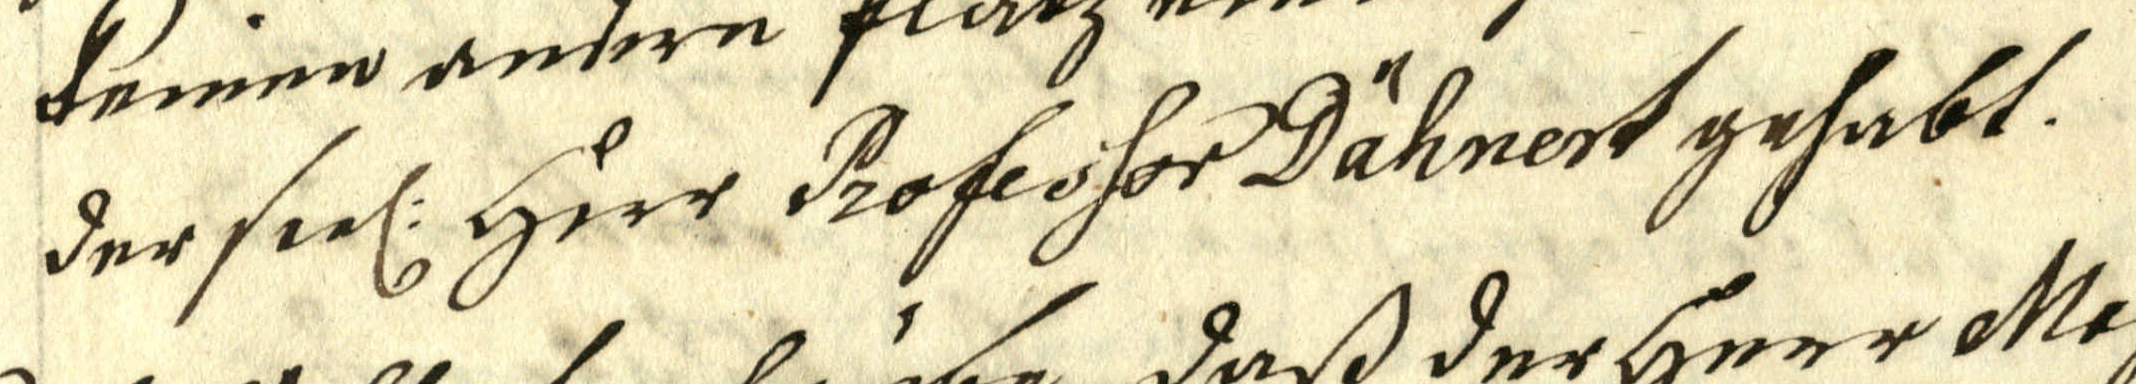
der seel. Herr Professor Dähnert gehabt.
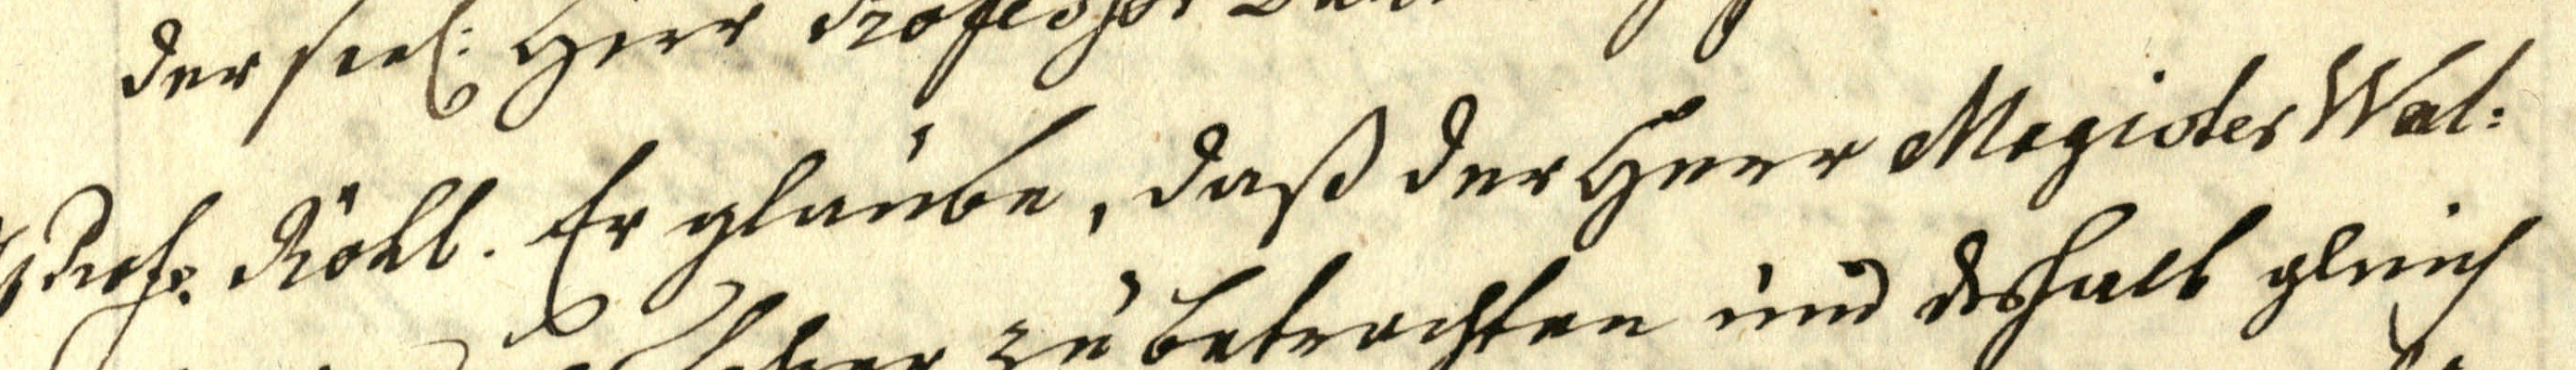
dh Prof. Röhl. Er glaube, daß der Herr Magister Wal¬
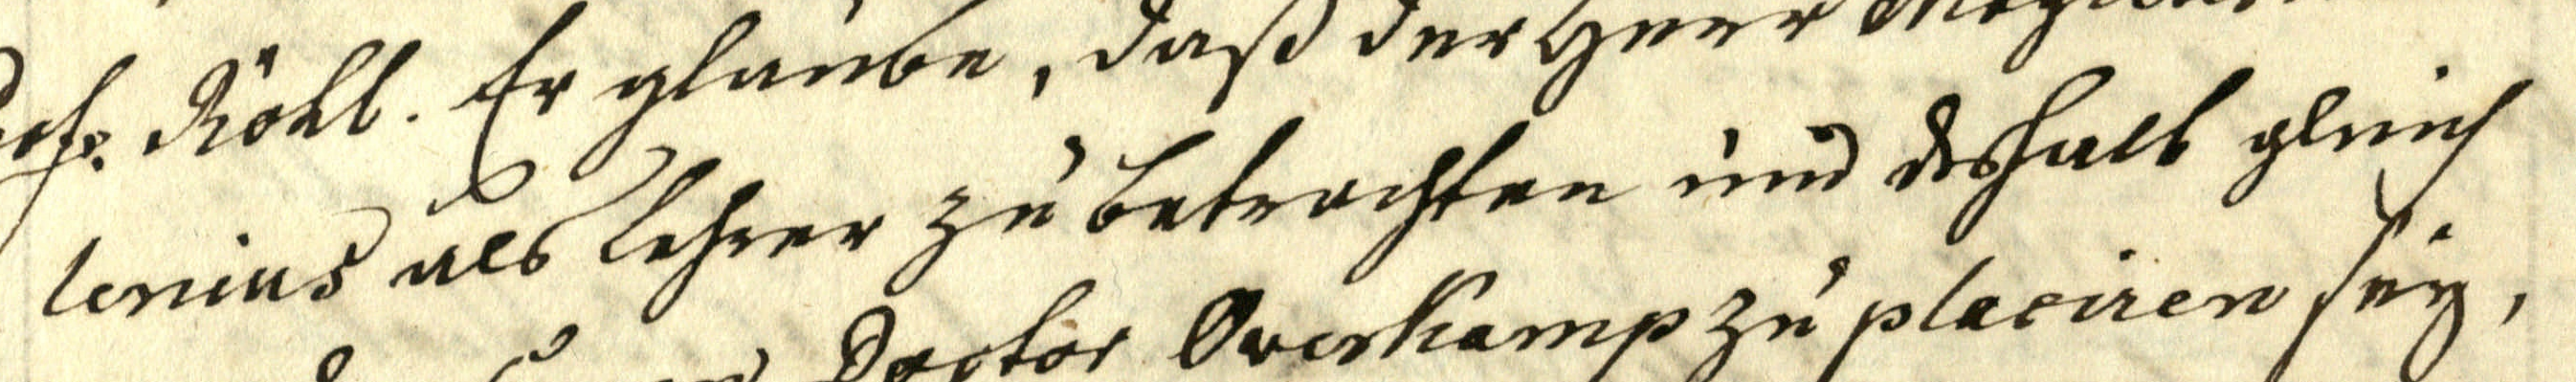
lenius als Lehrer zu betrachten und deshalb gleich
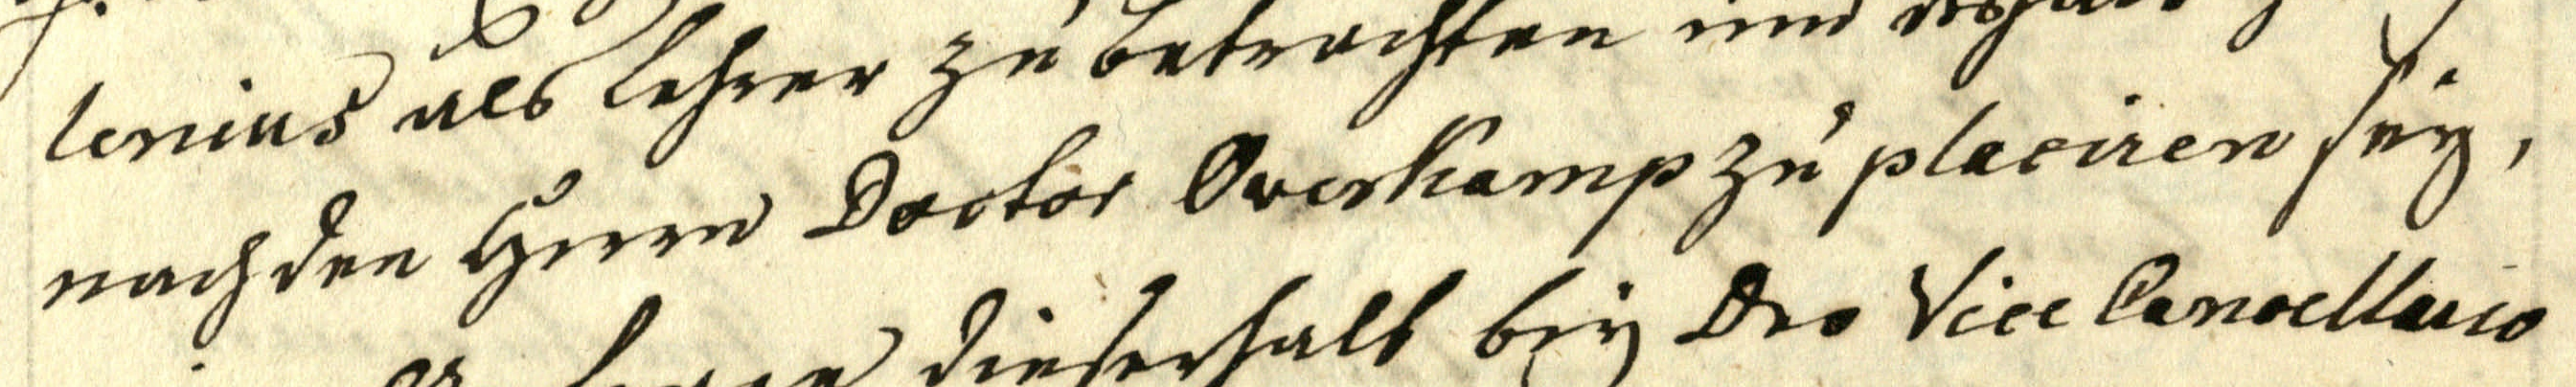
nach den Herrn Doctor Overkamp zu placiren seÿ,
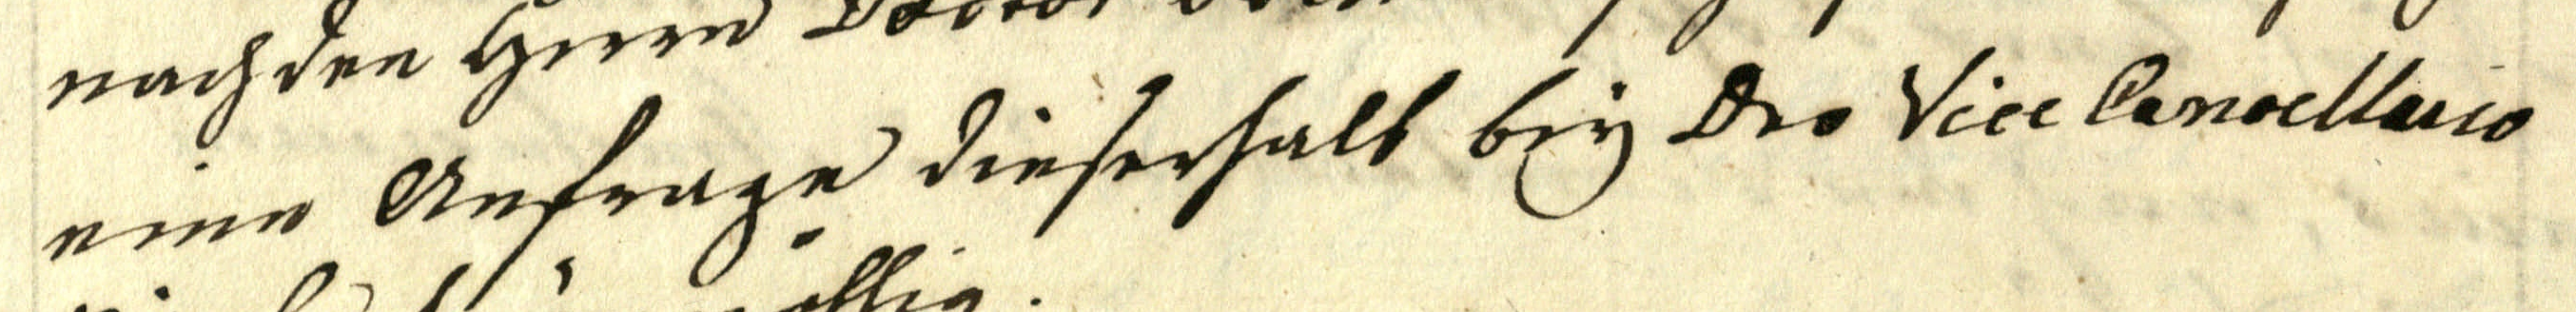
eine Anfrage dieserhalb beÿ Dno Vice Cancellario
